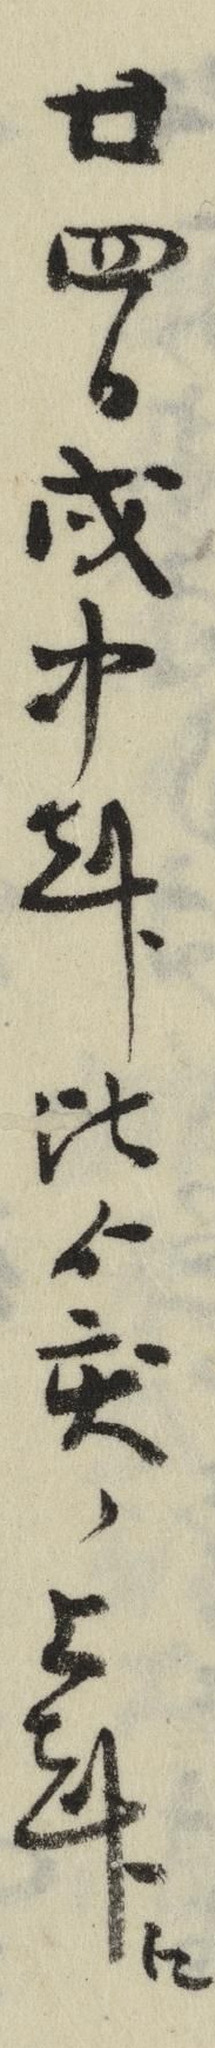廿四日戌中刻比ゟ亥上刻江
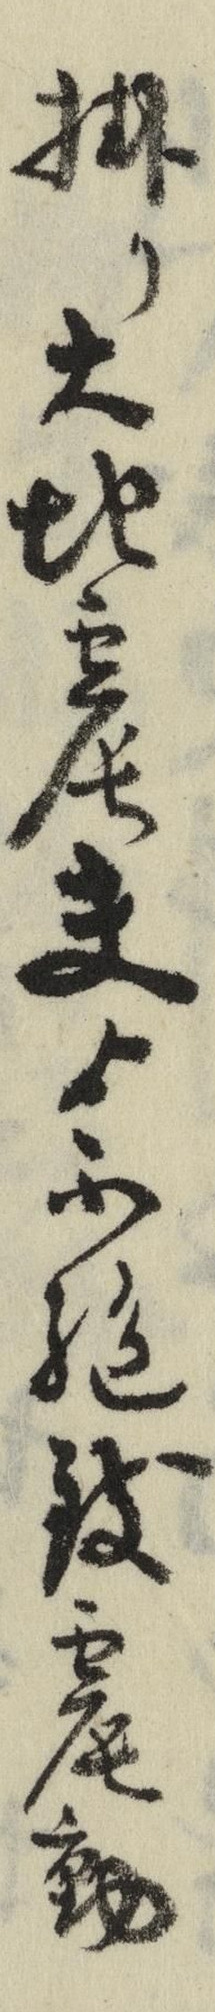掛り大地震夫ゟ不絶致震動
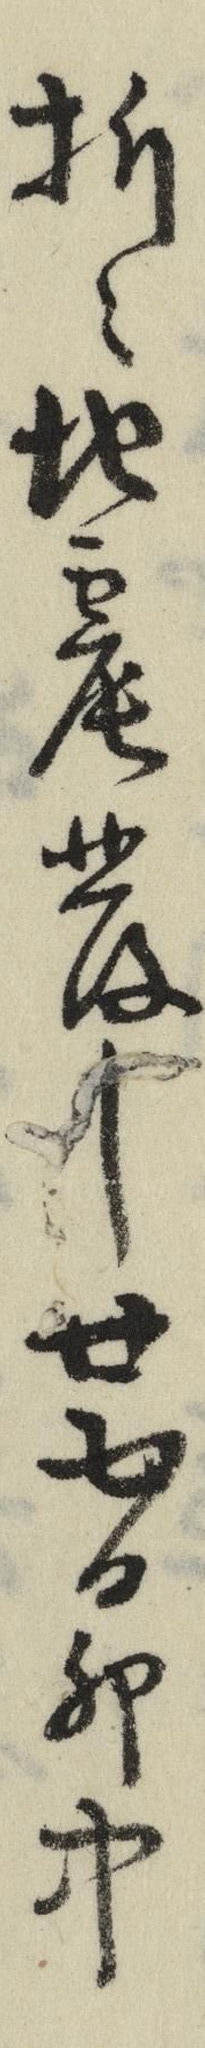折々地震発し廿七日卯中
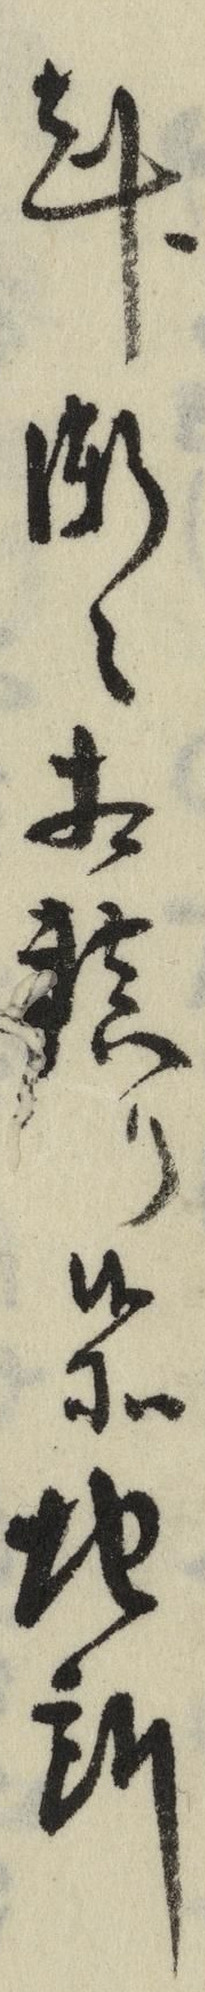刻漸々相鎮り候所地所
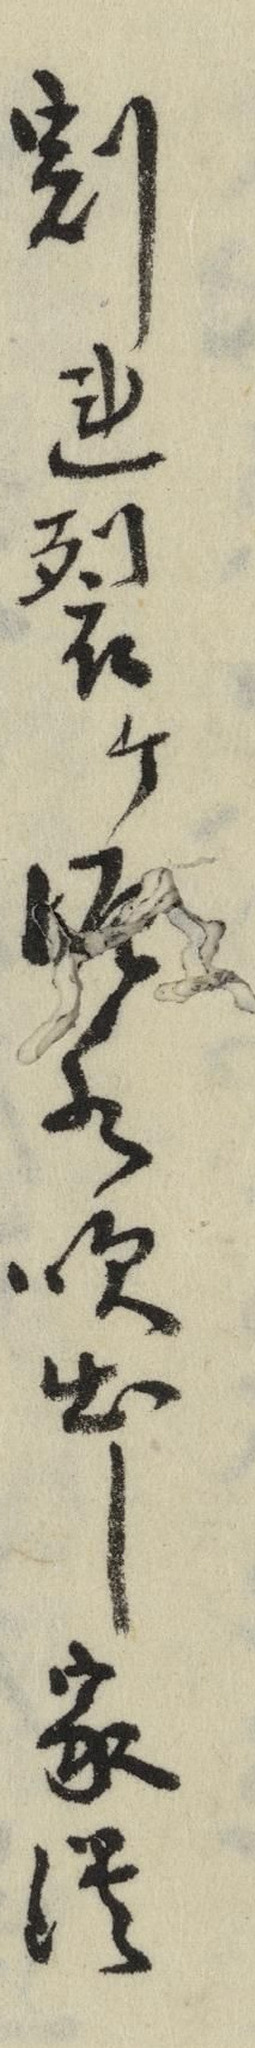割れ裂ヶ泥水吹出し潰家
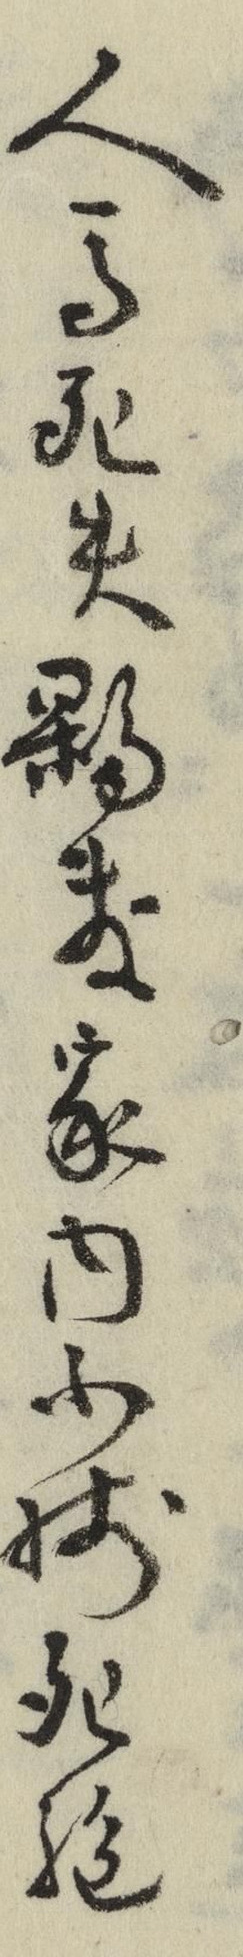人馬死失夥敷家内不残死絶
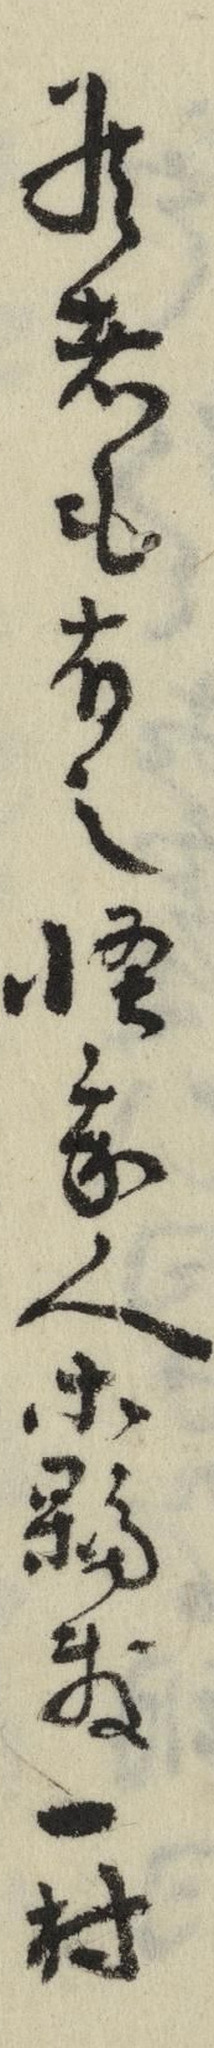候者も有候怪我人等夥敷一村
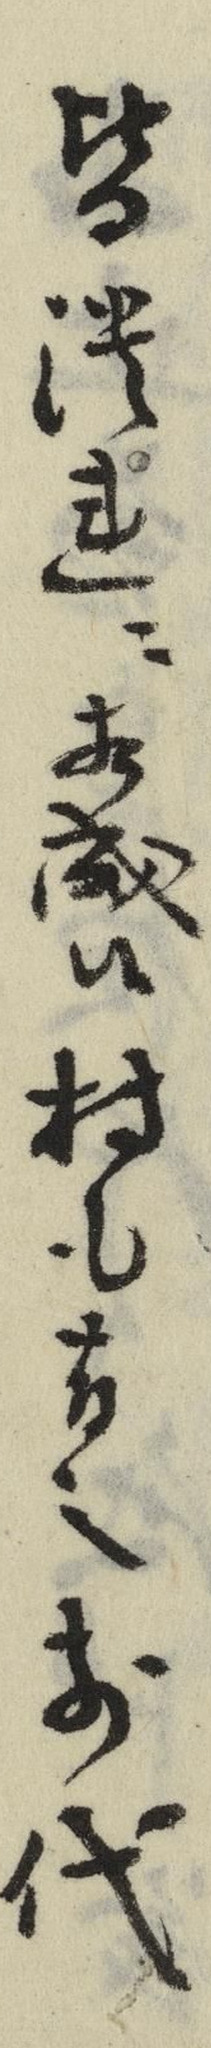皆潰れ二相成候村も有之前代

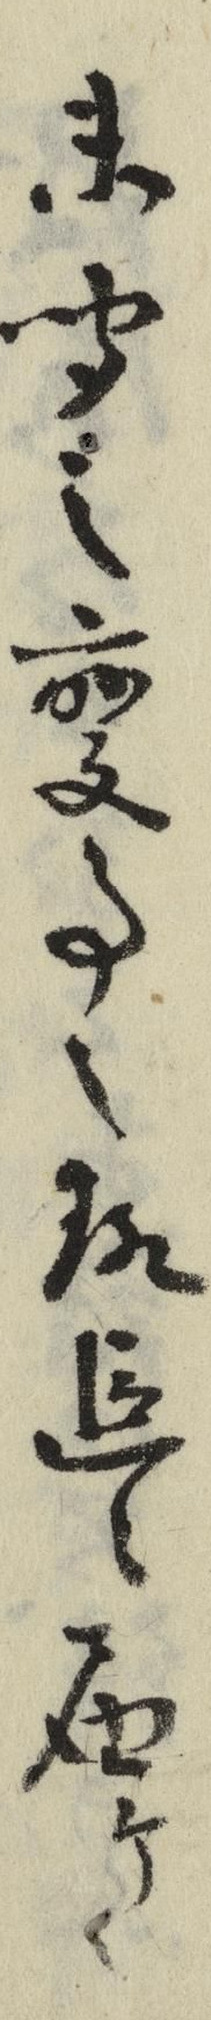未聞変事之趣追々届ヶ
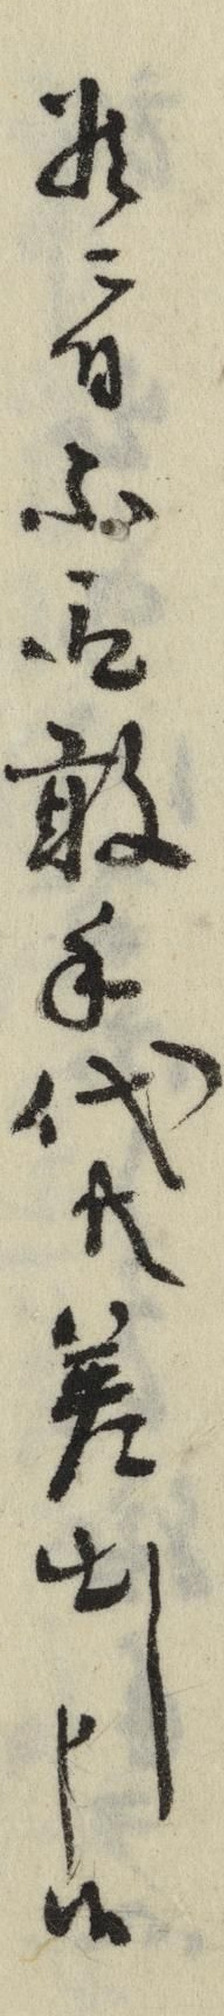候二付不取敢手代共差出し申候
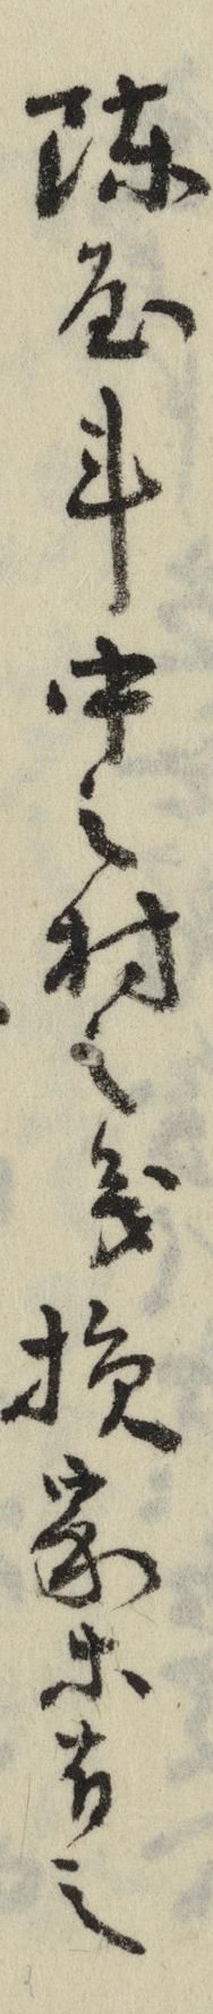陣屋斗中之村之義損家等有之
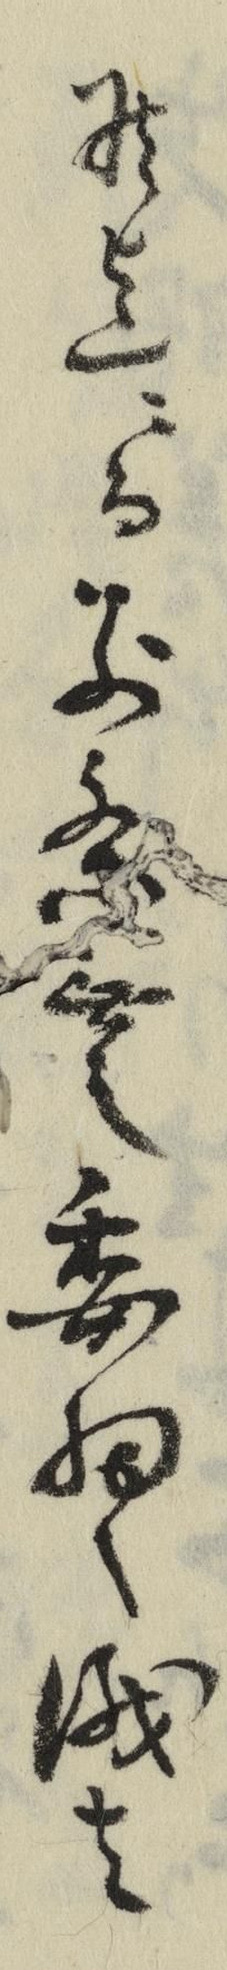候迄二而別条無之細之儀は
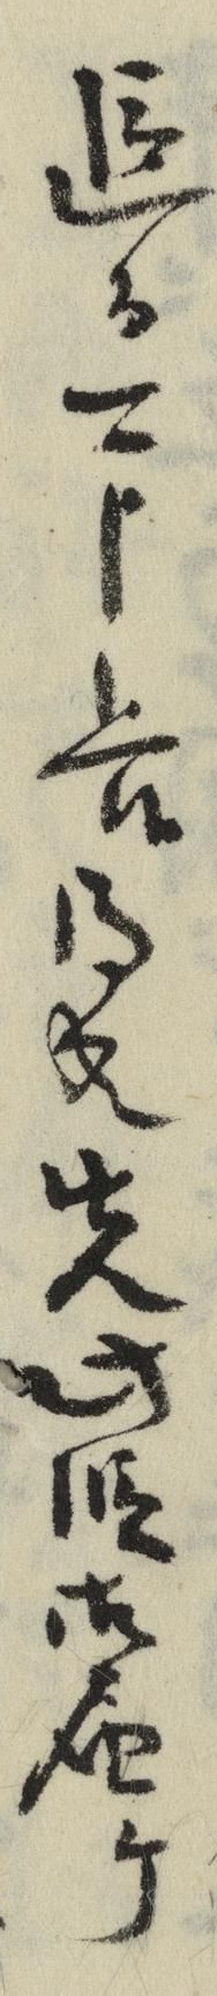追而可申上候得共先此段御届ヶ
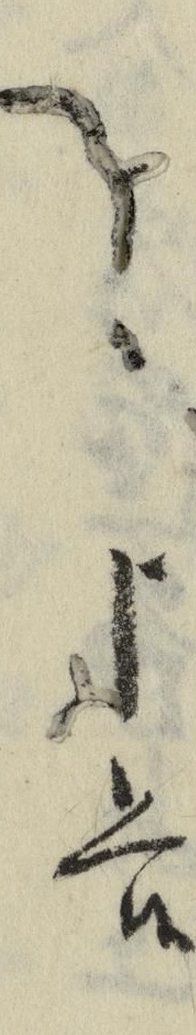申上候
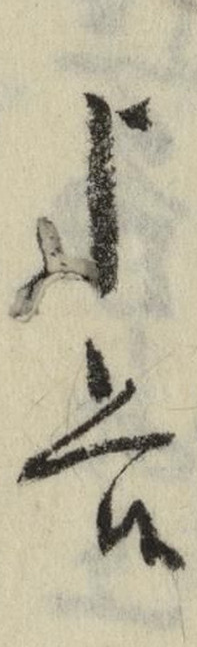申上候
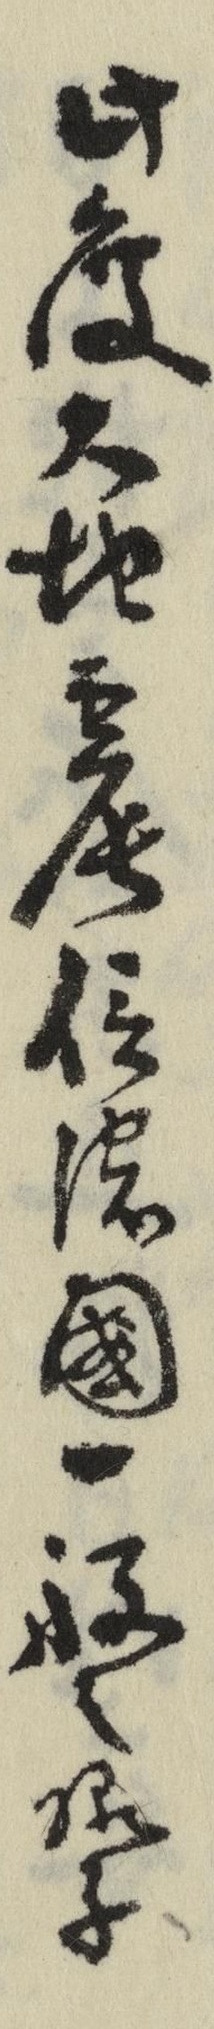此度大地震信濃国一般之様子
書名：信州大地震一件之冩　丁未弘化四年三月吉日
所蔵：東京大学地震研究所図書室 Earthquake Research Institute Library, The University of Tokyo, JAPAN
